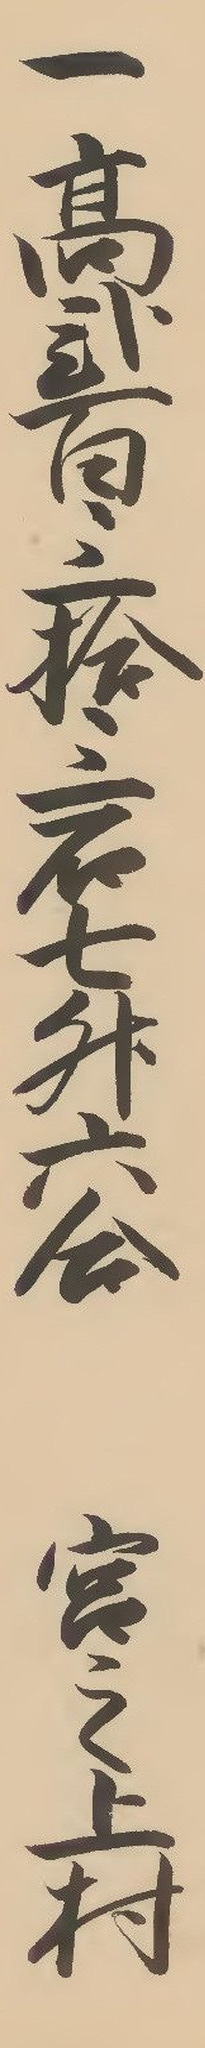一高弐百三拾三石七升六合宮之上村

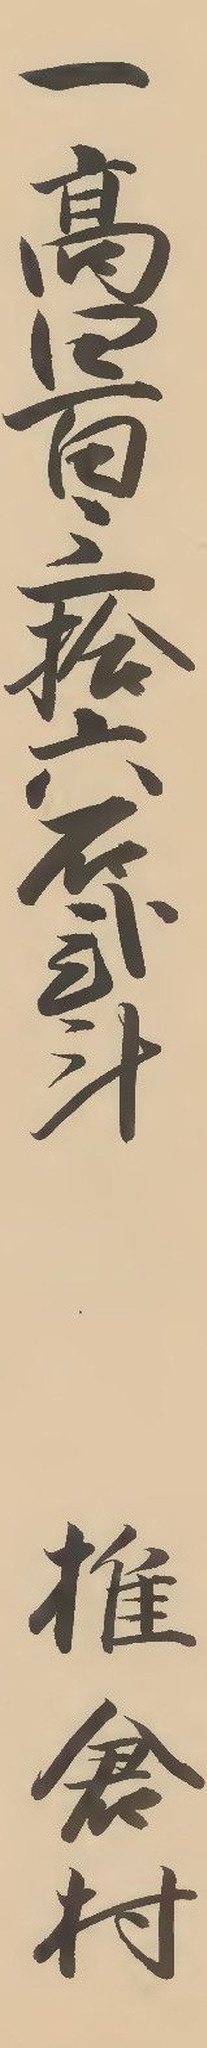一高四百三拾六石弐斗椎倉村
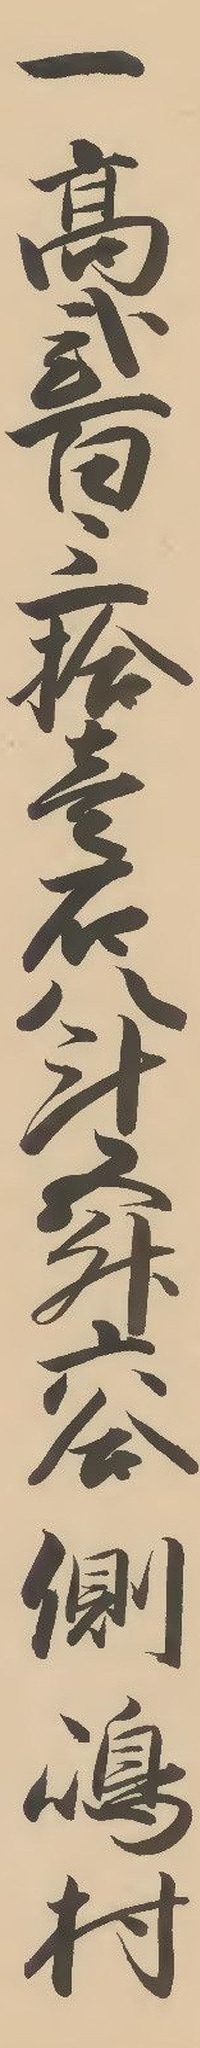一高弐百三拾壱石八斗五升六合側島村
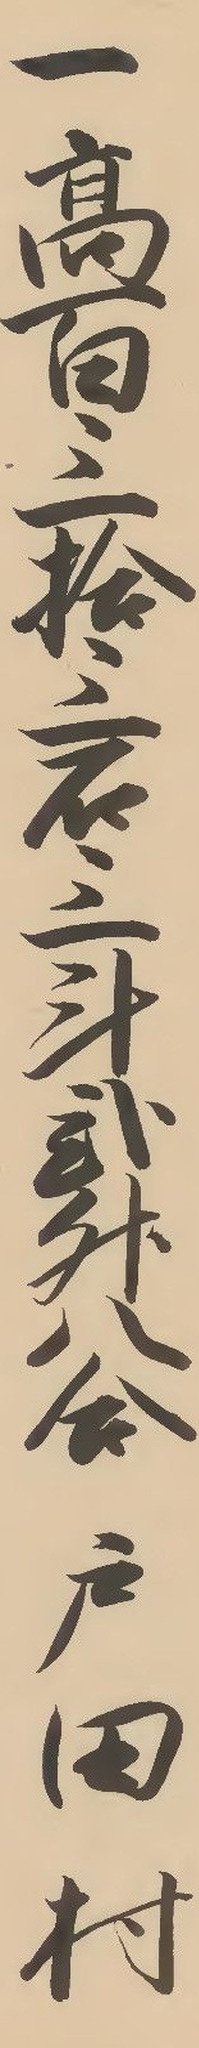一高百三拾三石三斗弐升八合戸田村
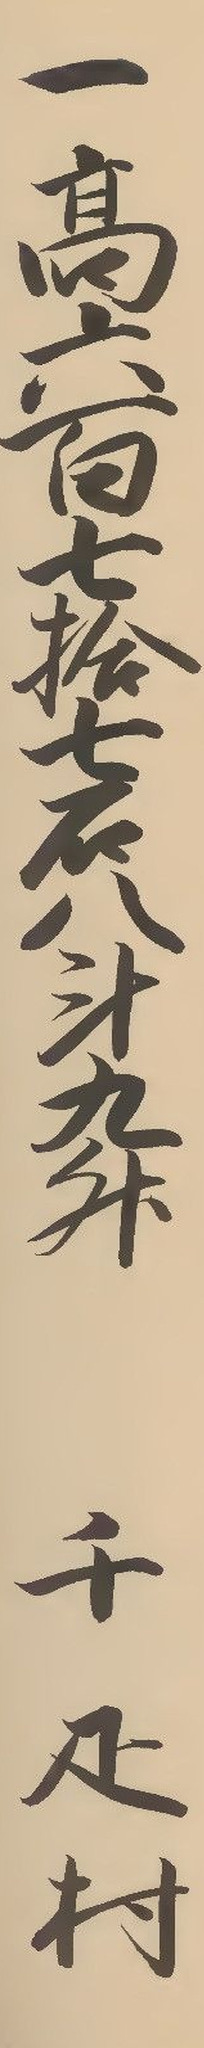一高六百七拾七石八斗九升千疋村
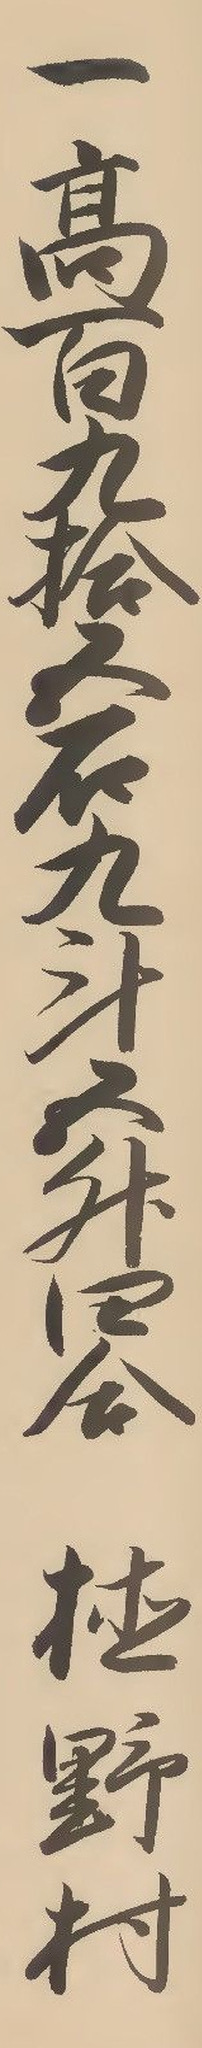一高百九拾五石九斗五升四合植野村
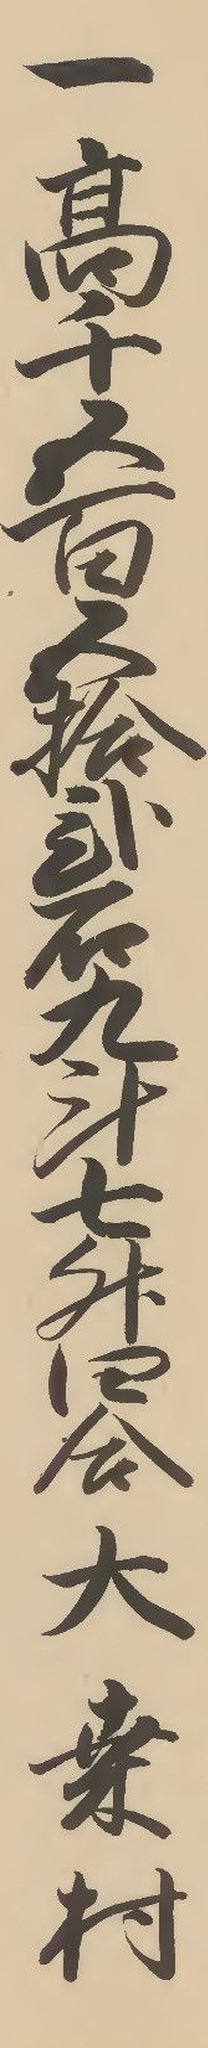一高千五百五拾弐石九斗七升四合大桑村
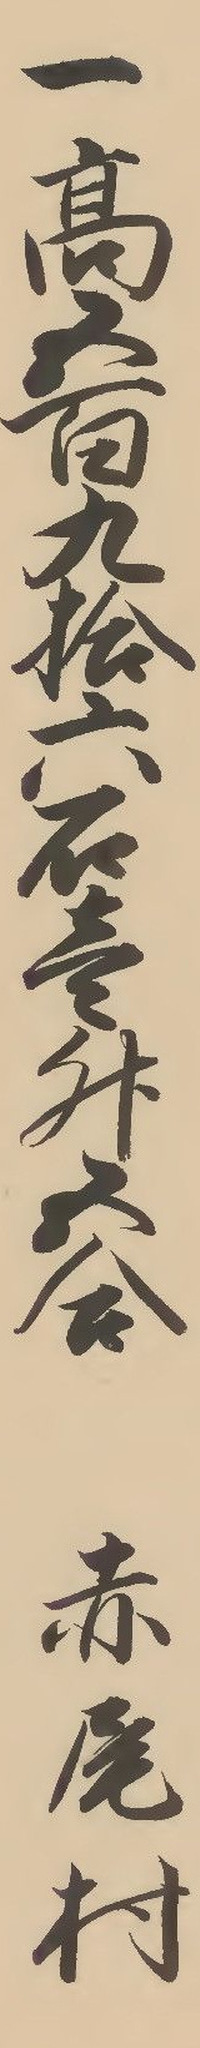一高五百九拾六石壱升五合赤尾村

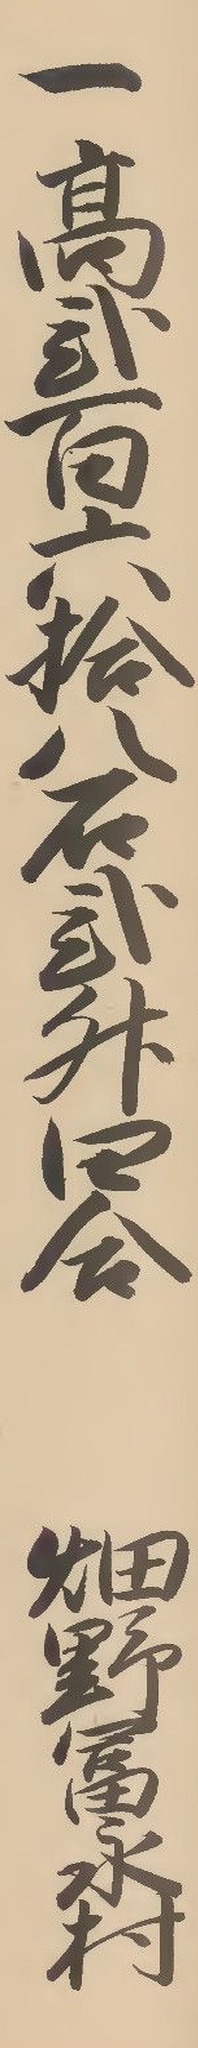一高弐百六拾八石弐升四合畑野富永村
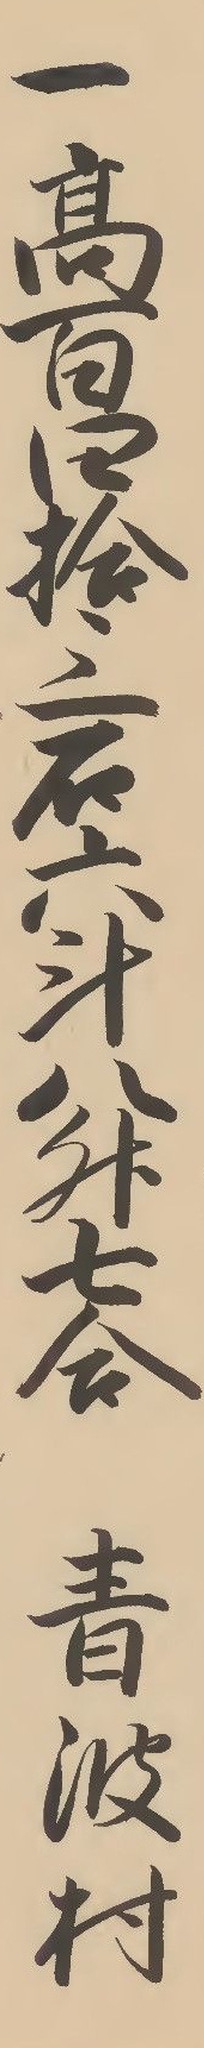一高百四拾三石六斗八升七合青波村
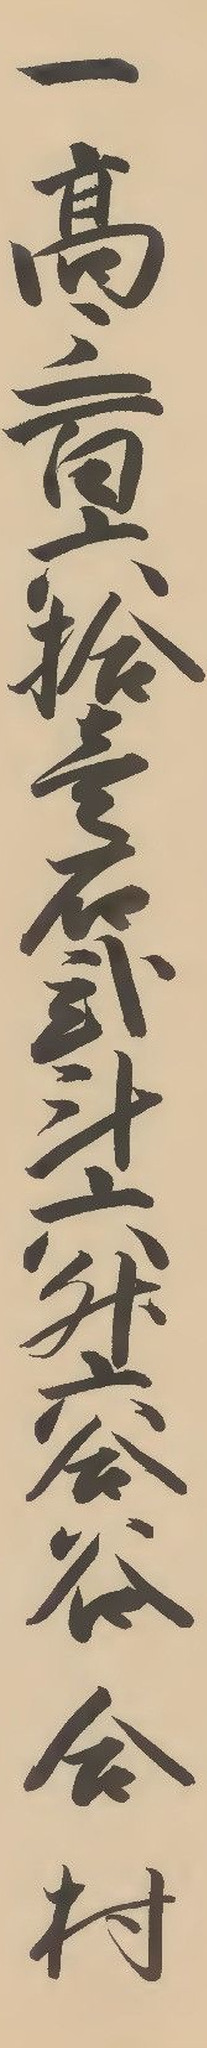一高三百六拾壱石弐斗六升六合谷合村
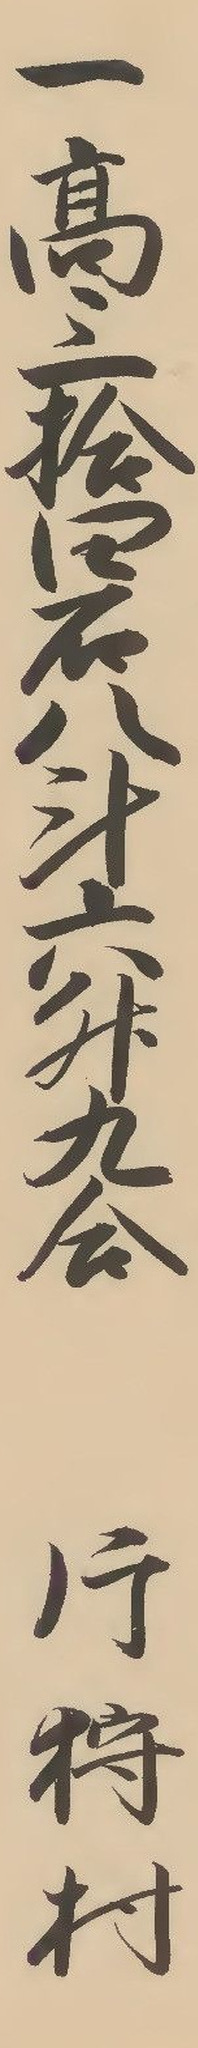一高三拾四石八斗六升九合片狩村

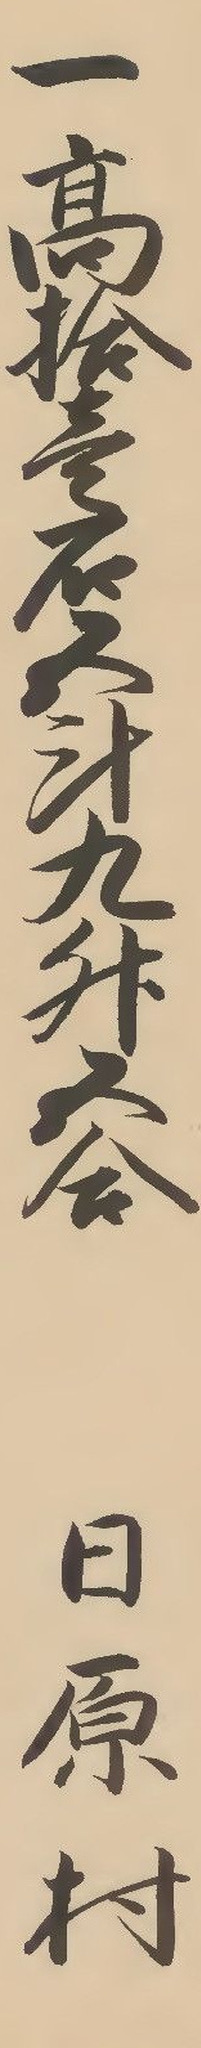一高拾壱石五斗九升五合日原村
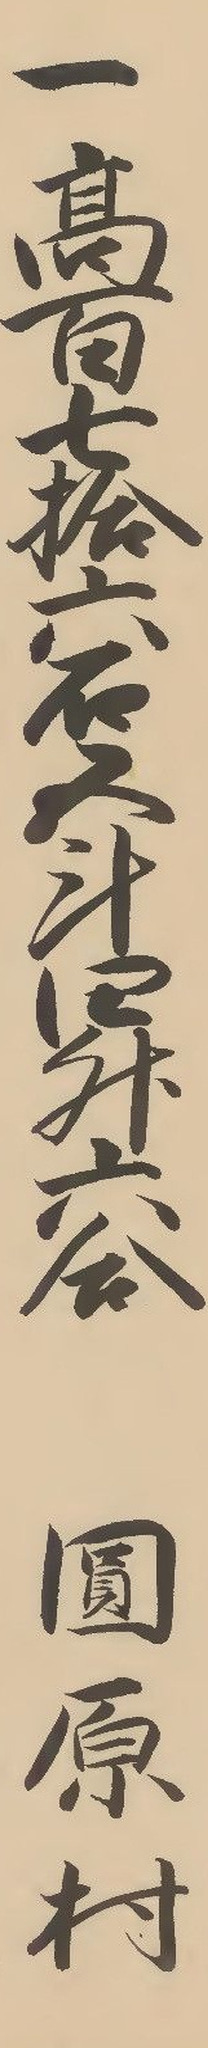一高百七拾六石五斗四升六合円原村
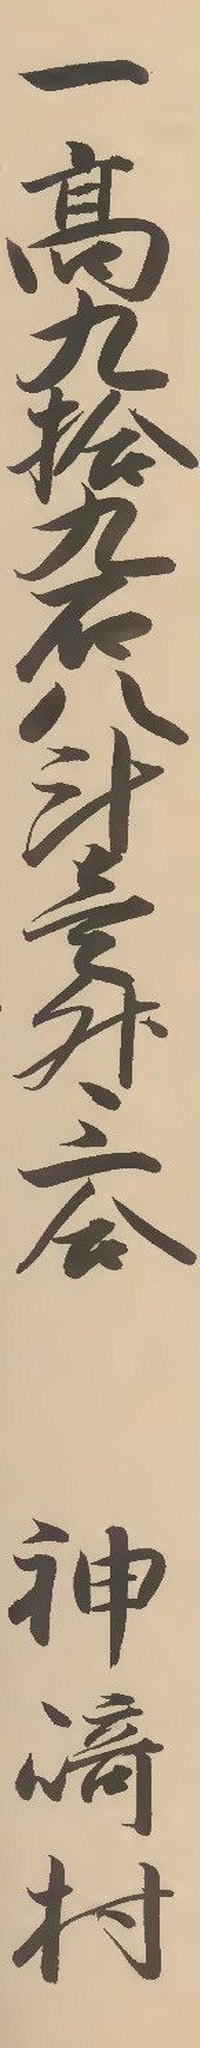一高九拾九石八斗壱升三合神崎村
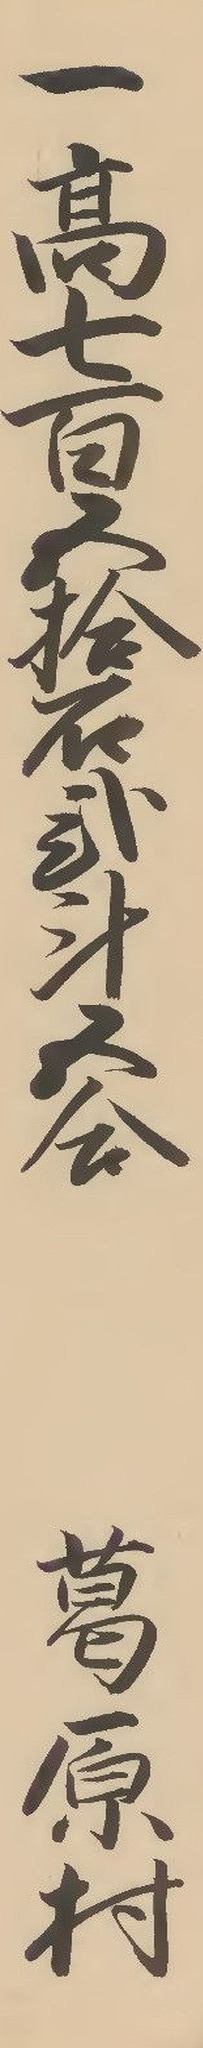一高七百五拾石弐斗五合葛原村
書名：美濃国郷帳
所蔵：国立公文書館 National Archives of Japan
